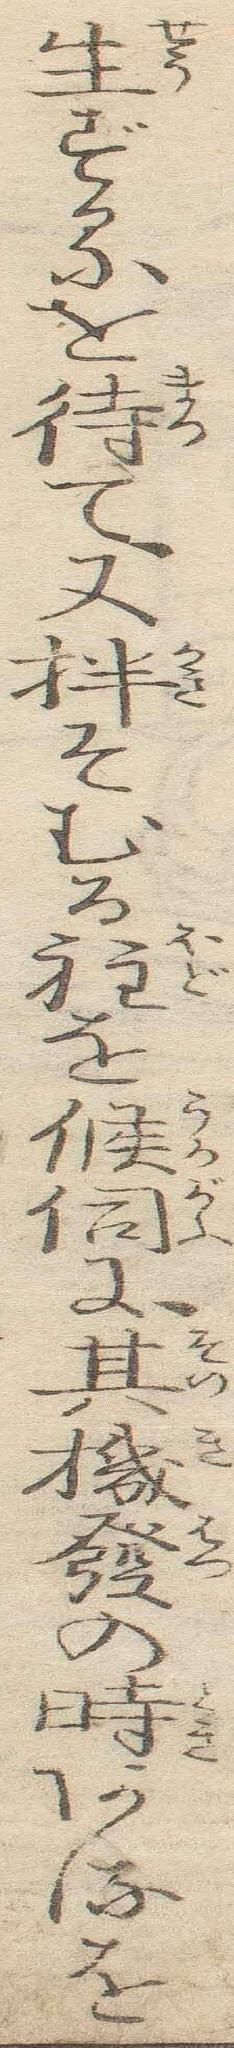生ずるを待て。又拌そむる程を候伺に。其機発の時あるを
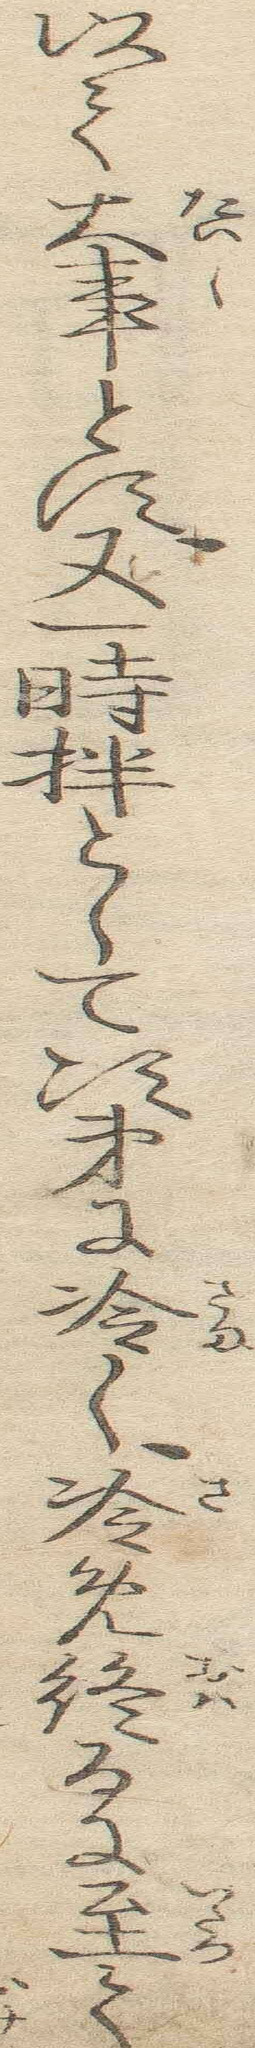以て大事とす。又一時拌として次第に冷し。冷め終るに至て
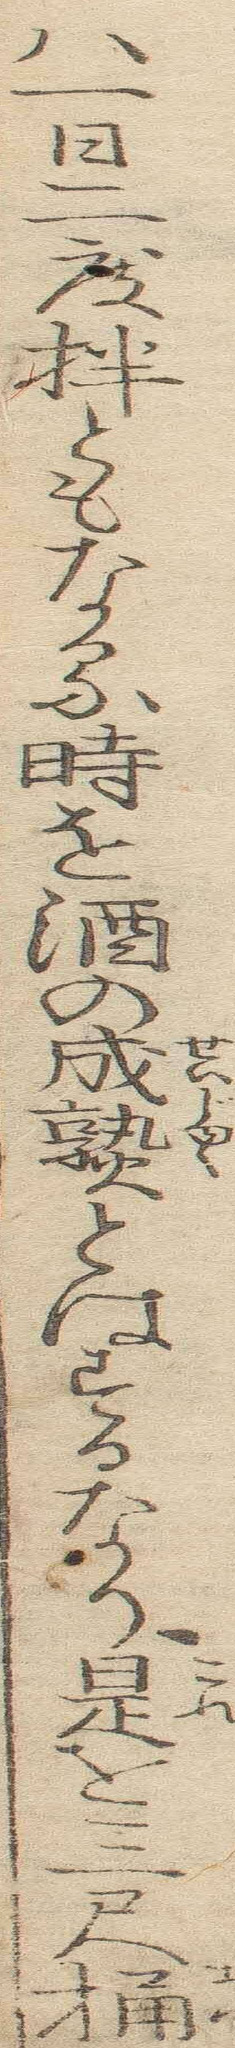は一日二度拌ともなる時を酒の成熟とはするなり。是を三尺桶

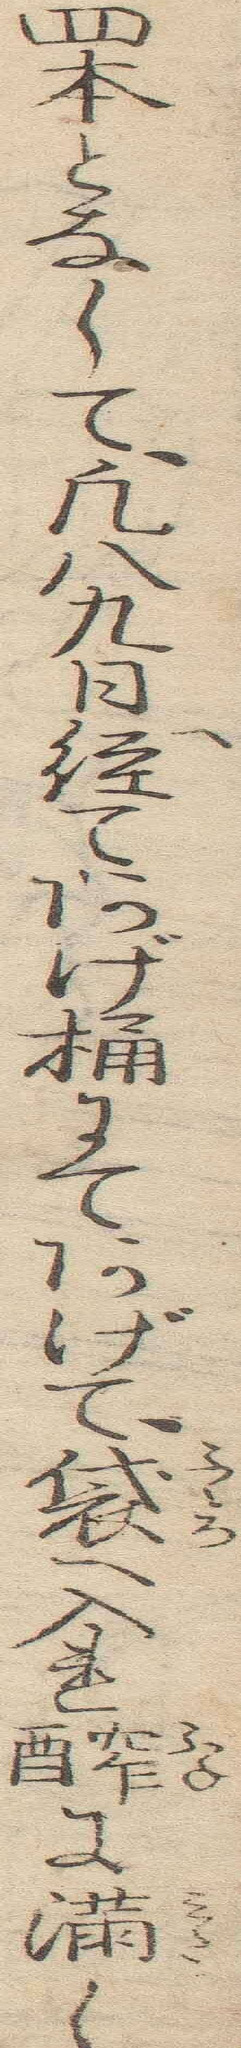四本となして。凡八九日経てあげ桶にてあげて。袋へ入れ醡に満し
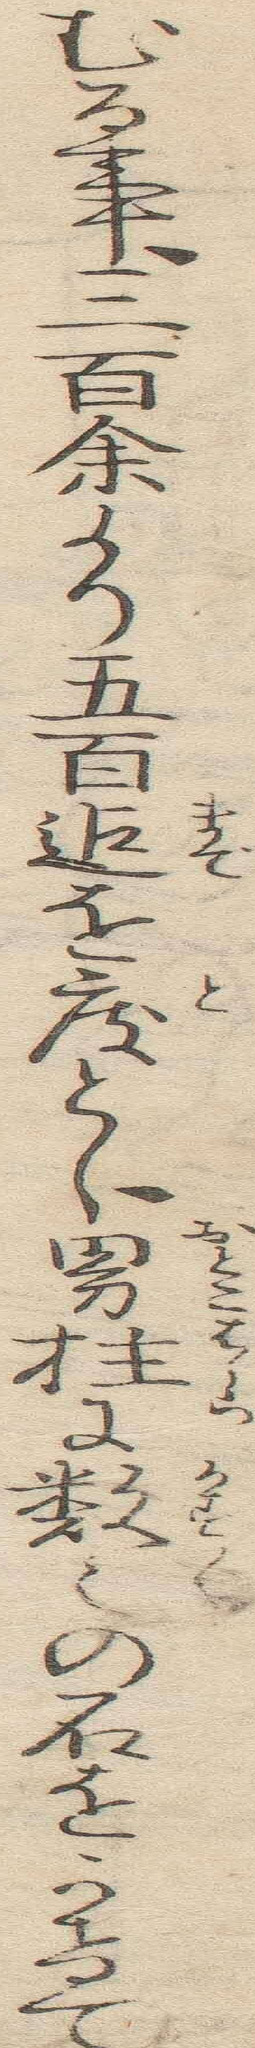むる事。三百余より五百迄を度とし。男柱に数〳〵の石をかけて
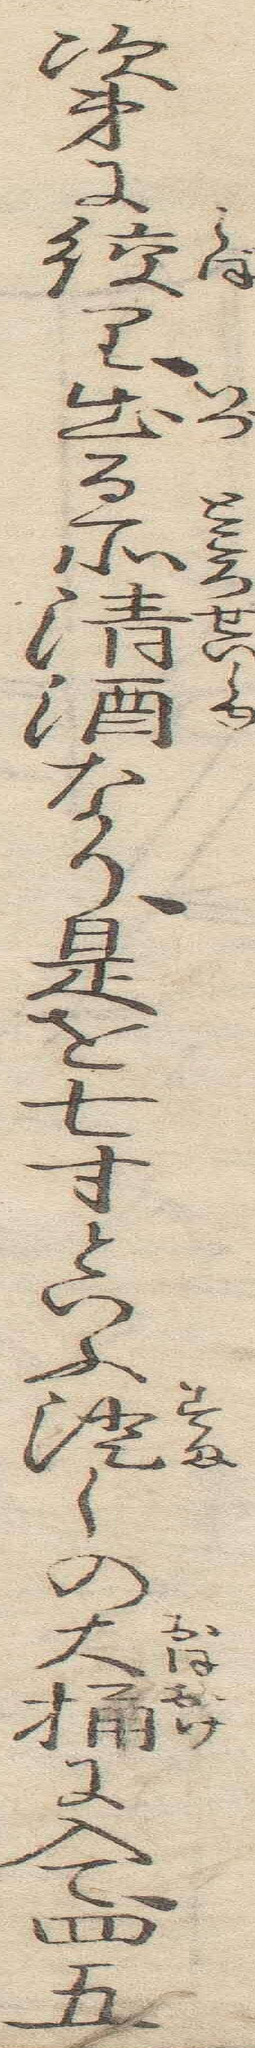次第に絞り。出る所清酒なり。是を七寸といふ澄しの大桶に入て。四五
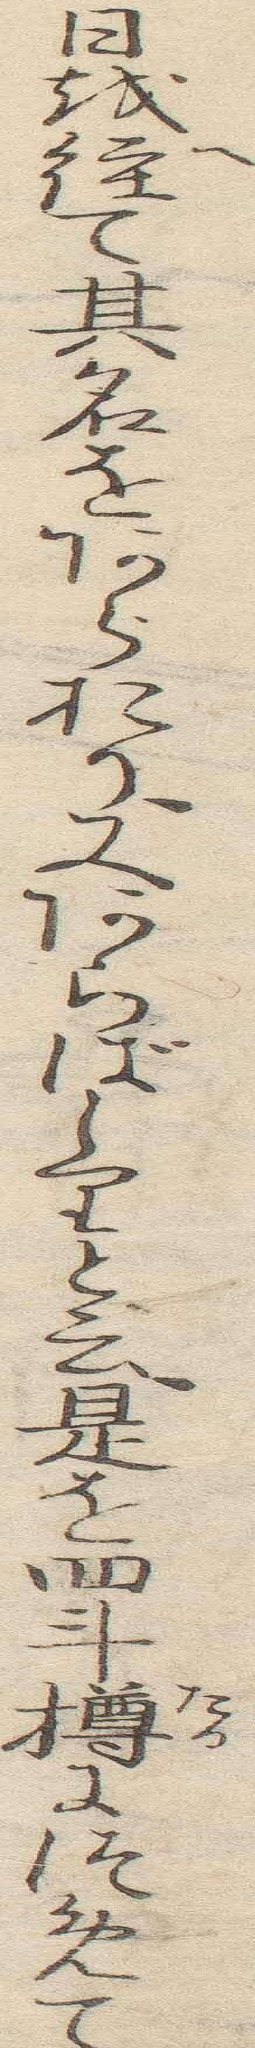日を経て其名をあらおり。又あらばしりと云。是を四斗樽につめて
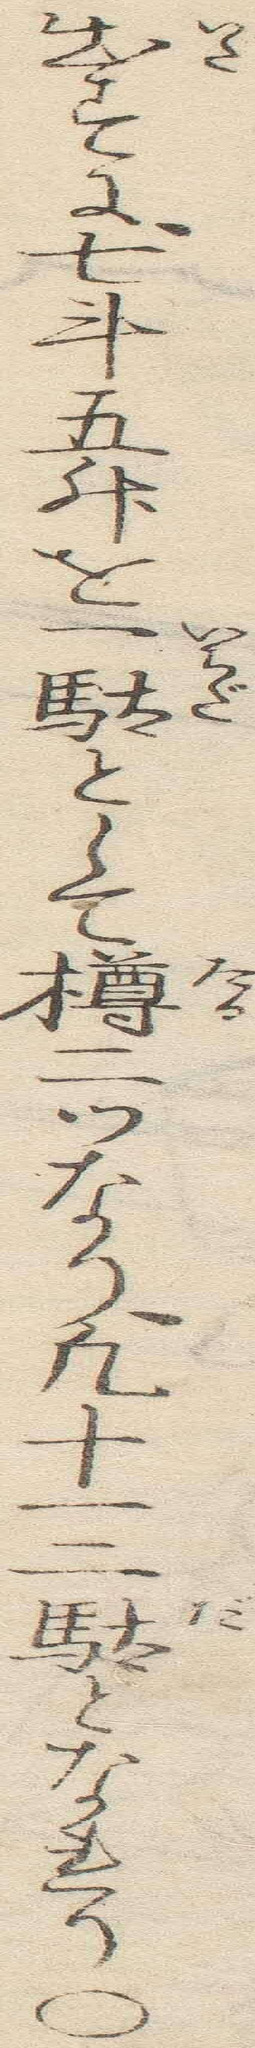出すに。七斗五升を一駄として樽二ツになり。凡十一二駄となれり○
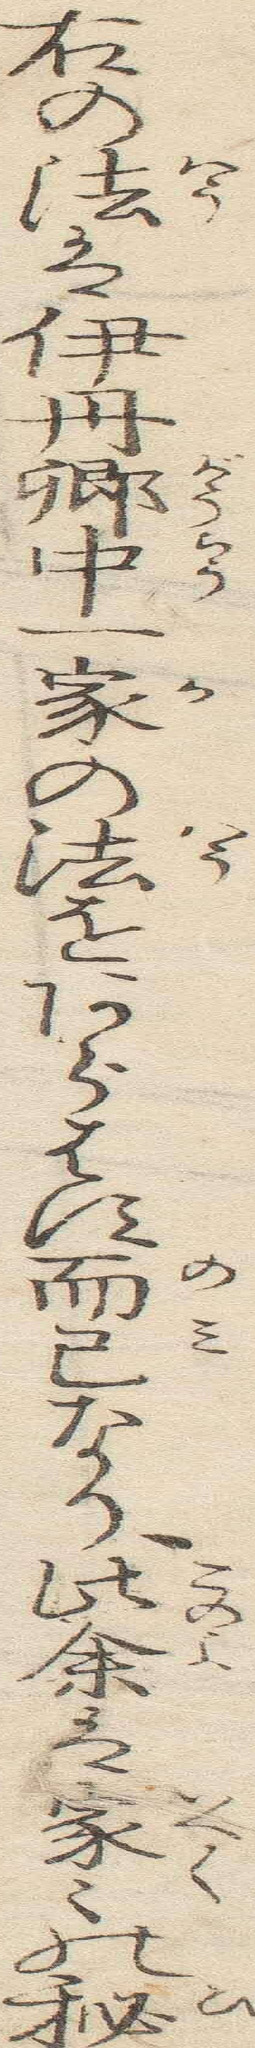右の法は伊丹郷中一家の法をあらはす而已なり。此余は家々の秘
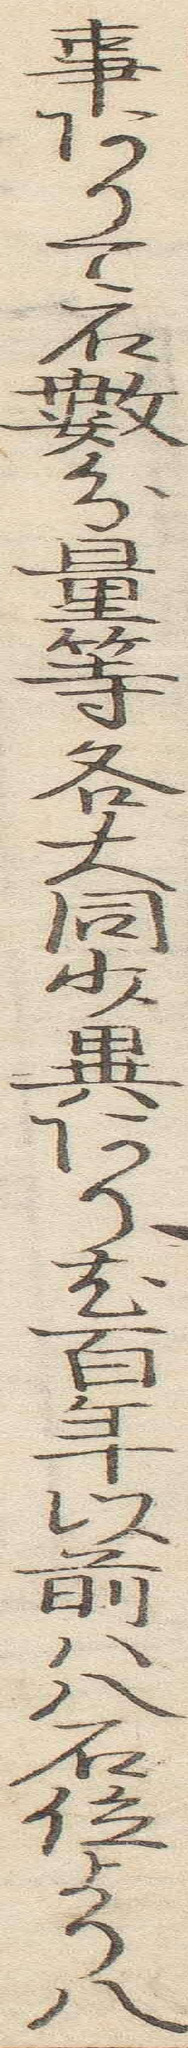事ありて石数分量等各大同少異あり。尤百年以前は八石位より八
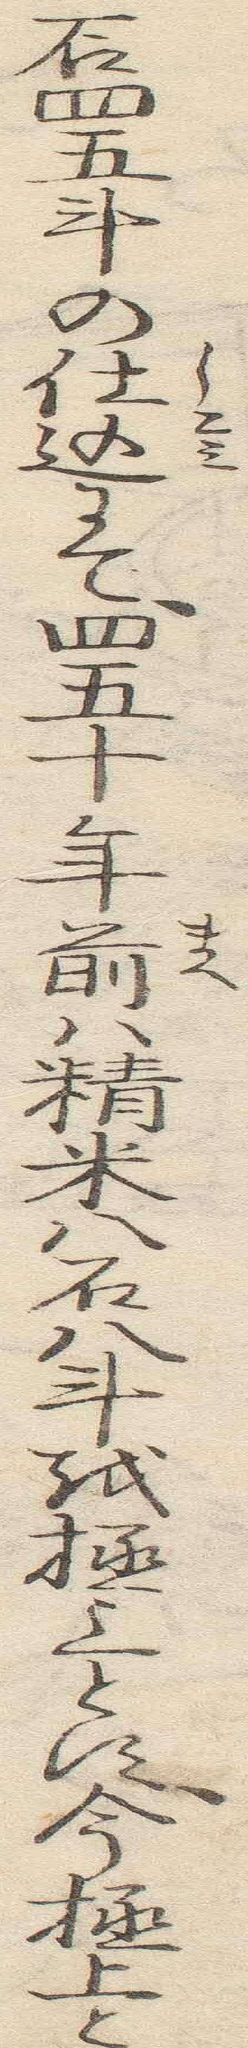石四五斗の仕込にて。四五十年前は精米八石八斗を極上とす。今極上と
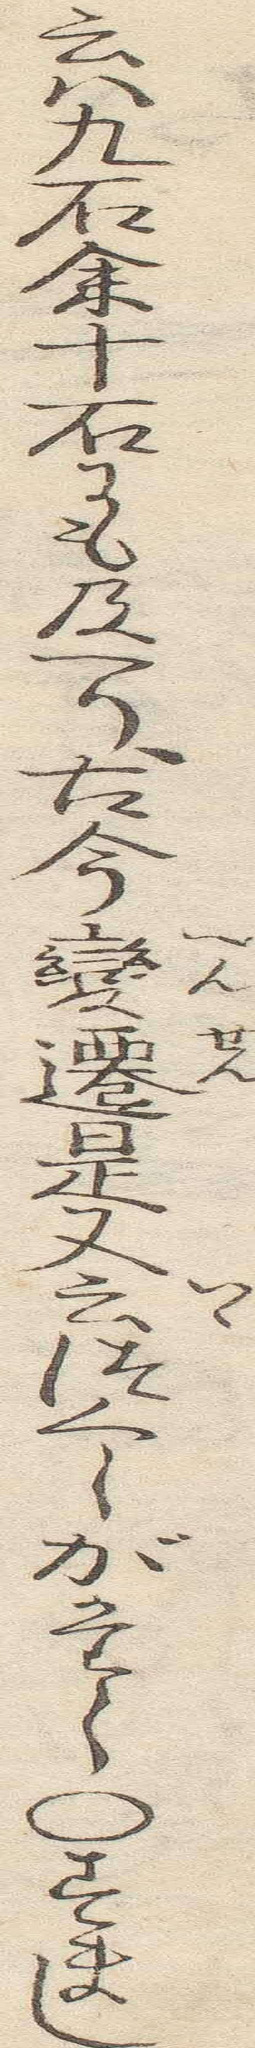云は九石余十石にも及へり。右今変遷是又云つくしがたし○すまし
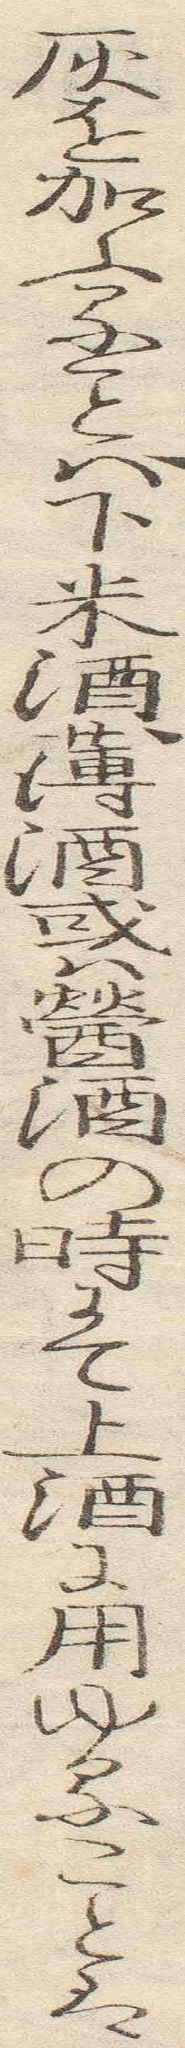灰を加ふることは。下米酒。薄酒或は醟酒の時にて上酒に用ゆることは
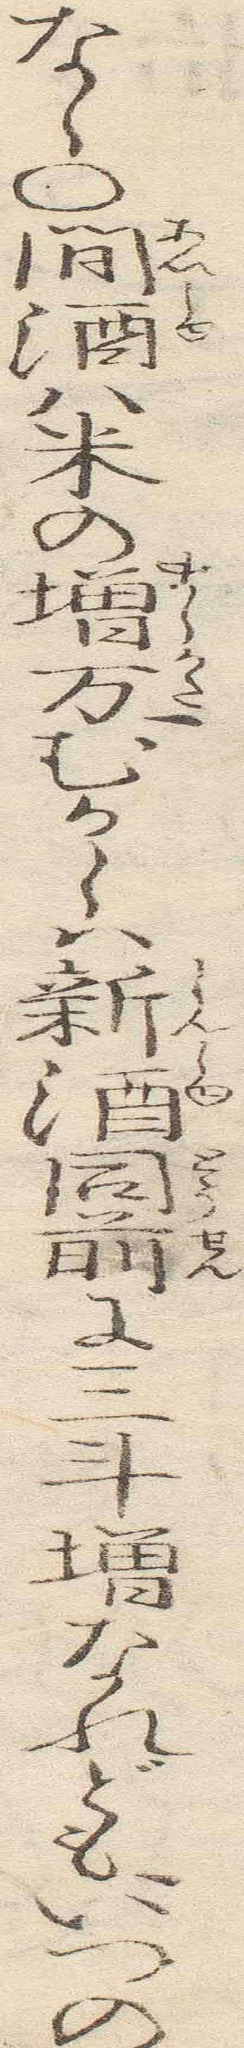なし○間酒は米の増方むかしは新酒同前に三斗増なれども。いつの
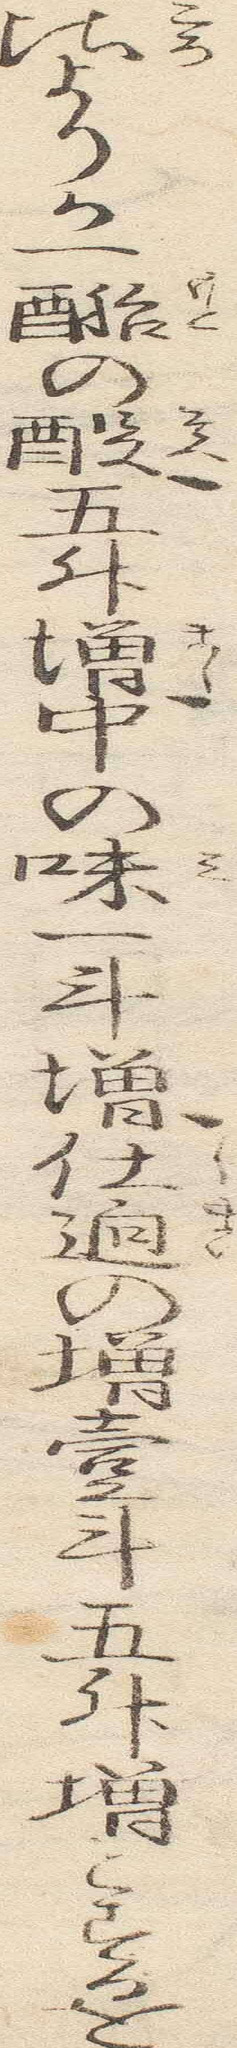比よりか一の酘。五升増。中の味一斗増。仕逈の増壱斗五升増とするを
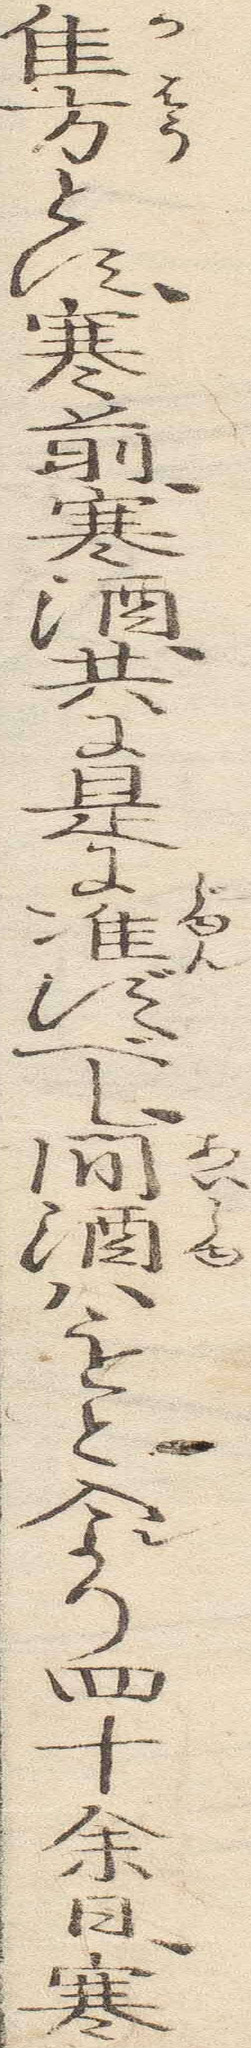隹方とす。寒前。寒酒。共に是に准ずべし。間酒はもと入より四十余日。寒
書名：日本山海名産図会
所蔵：東京学芸大学附属図書館 国文学研究資料館
